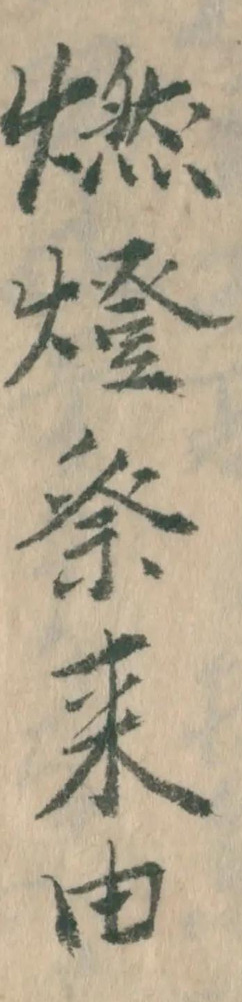燃燈祭来由

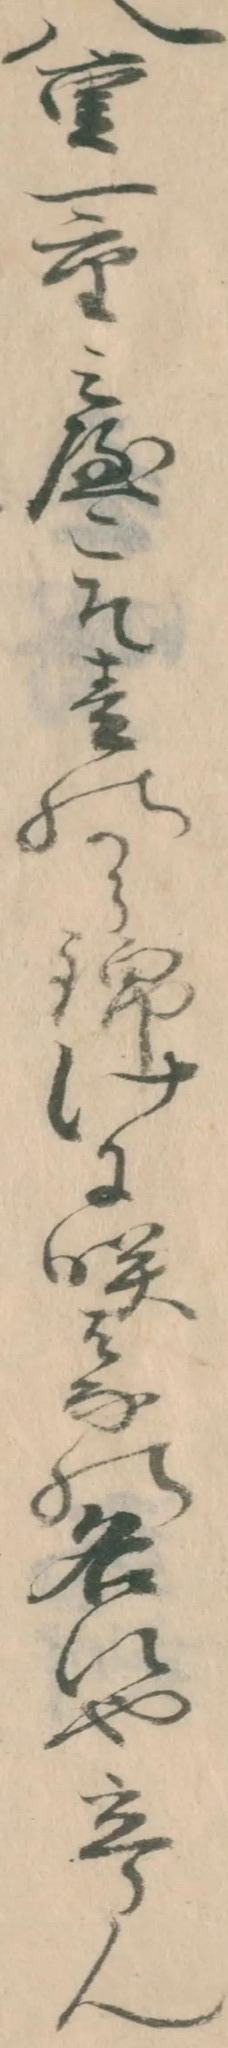八重一重みやこそ春のから錦けに咲はなの名にや立らん
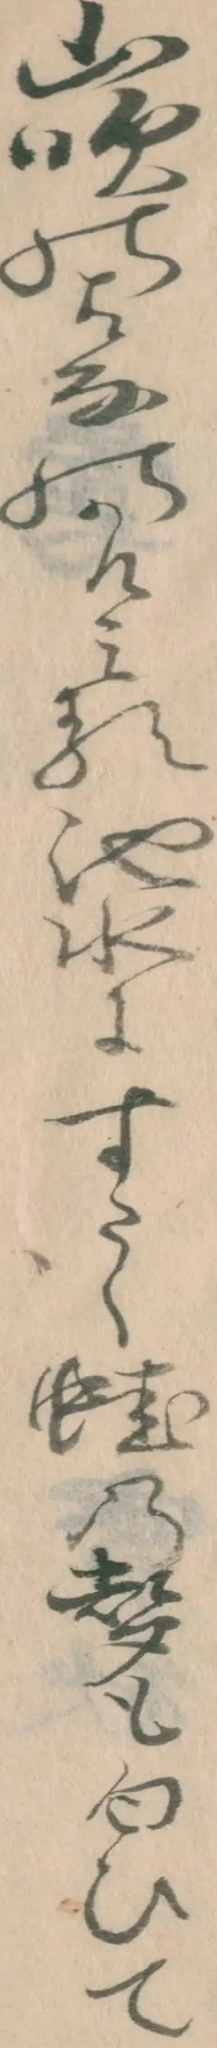山吹のはなのかけみる池水にすたく蛙の声も匂ひて
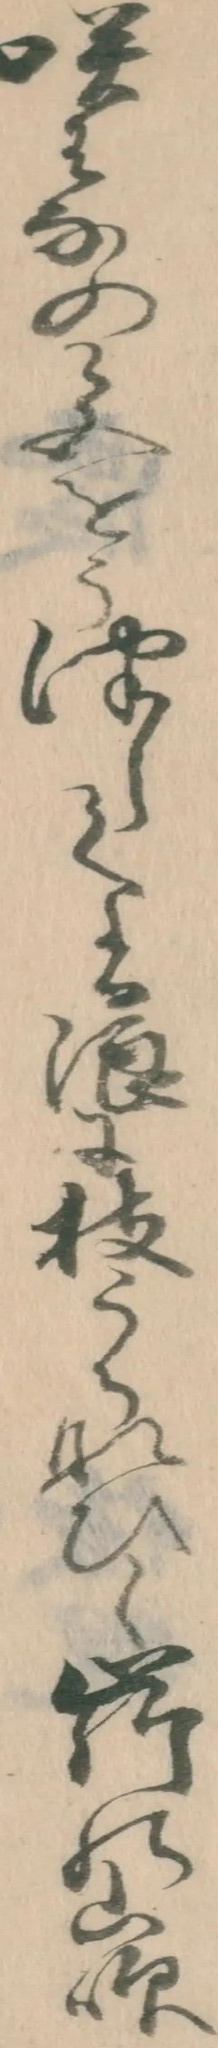咲はなの色をうつしてよる浪に枝うられなひし岸の山吹
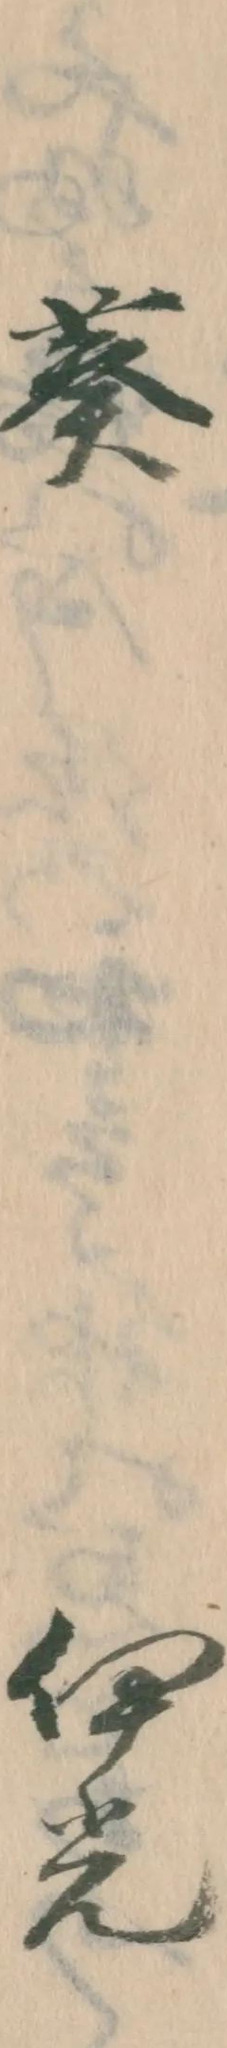葵伊光
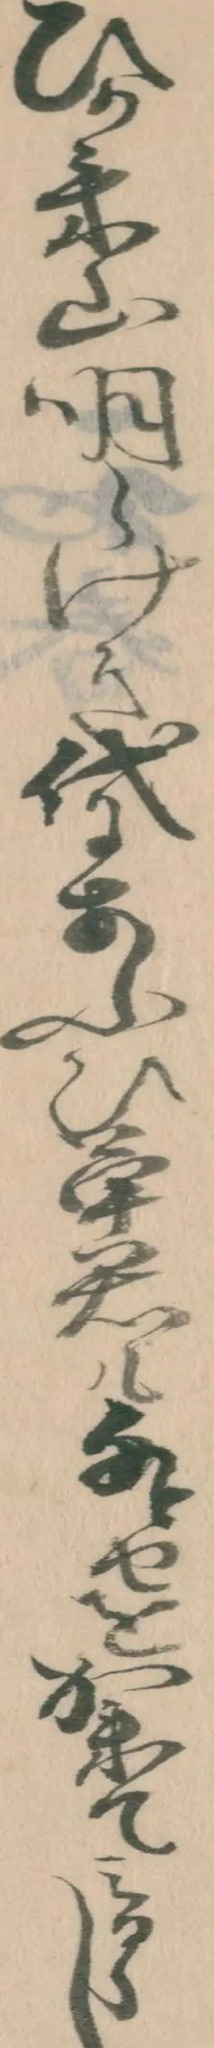ひかき山明らけき代にあふひ草君も千とせをかきてみるらし
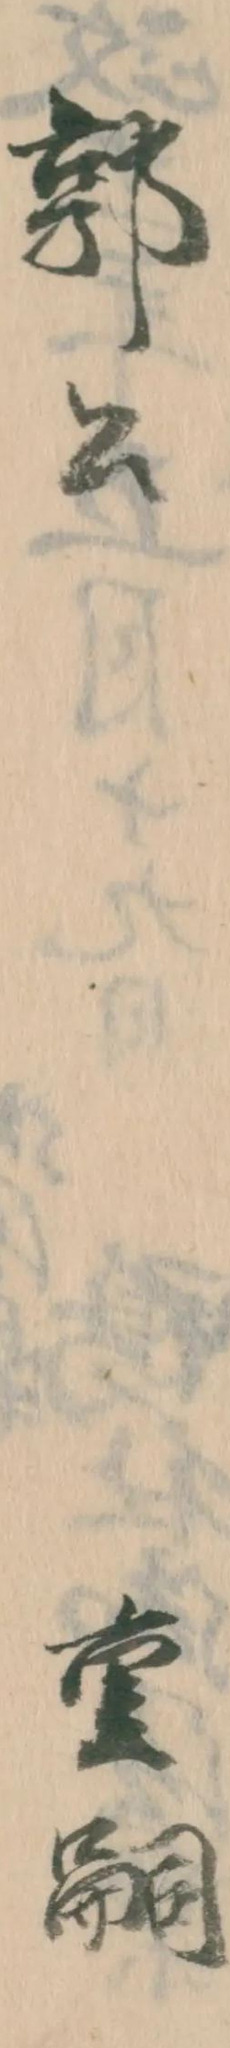郭公重嗣
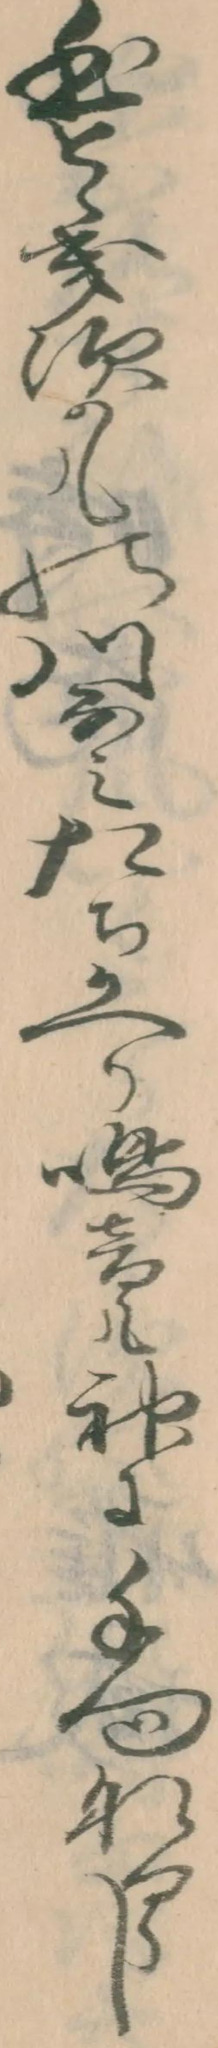ほとゝきすかもの川なみたちかへり鳴音も神に手向なるらし
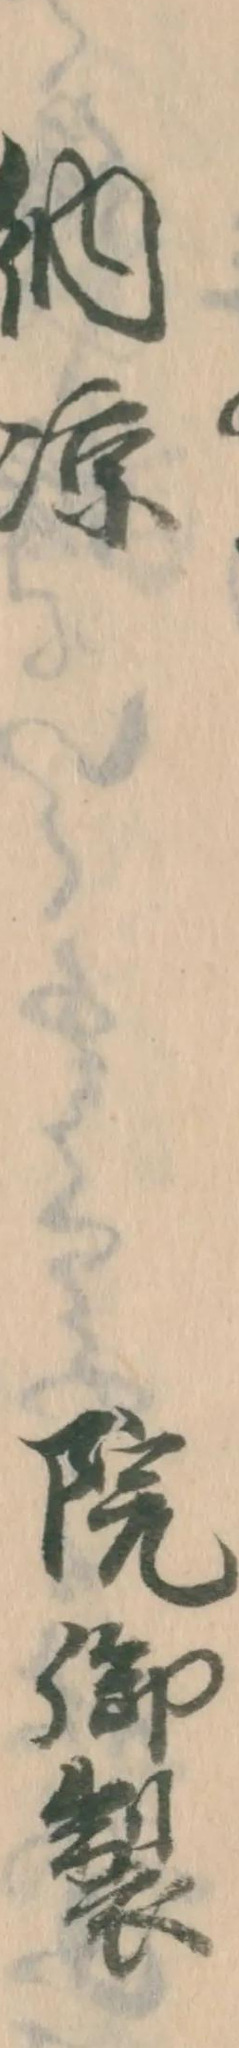納涼院御製
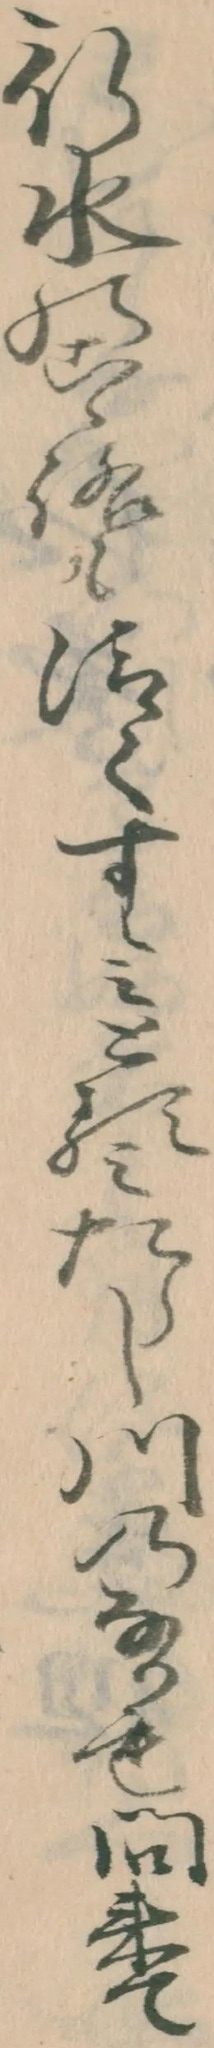行水のこゝろも清くすゝみとるみたらし川のなかれ問来て
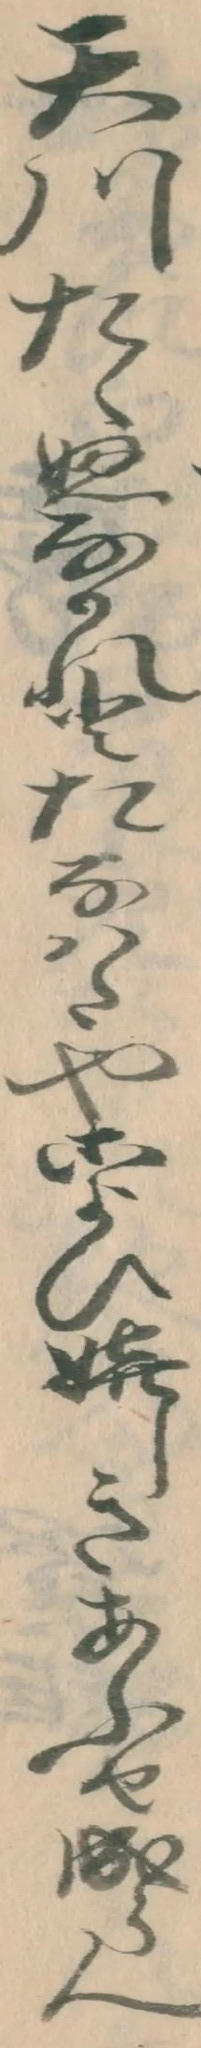天川たゝぬなかれとたなはたやこよひ嬉しきあふせ成らん
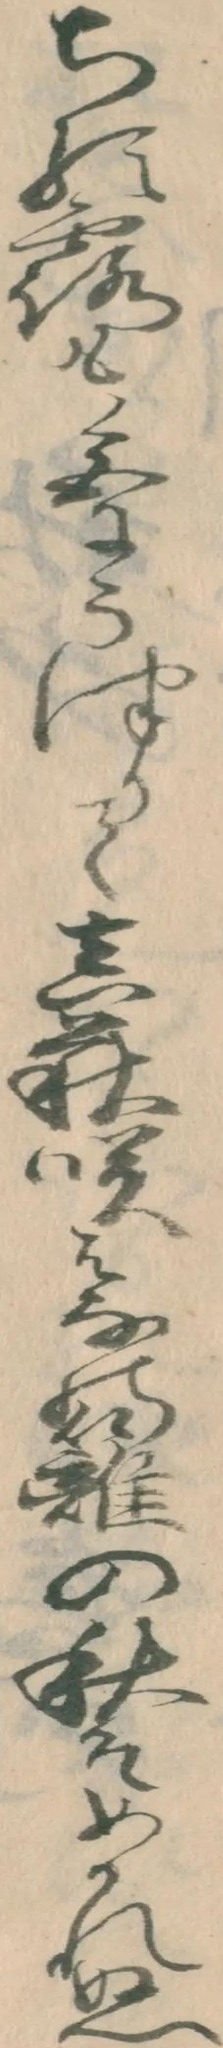ちる露も色にうつりて真萩咲はなの雞の秋そめかれぬ
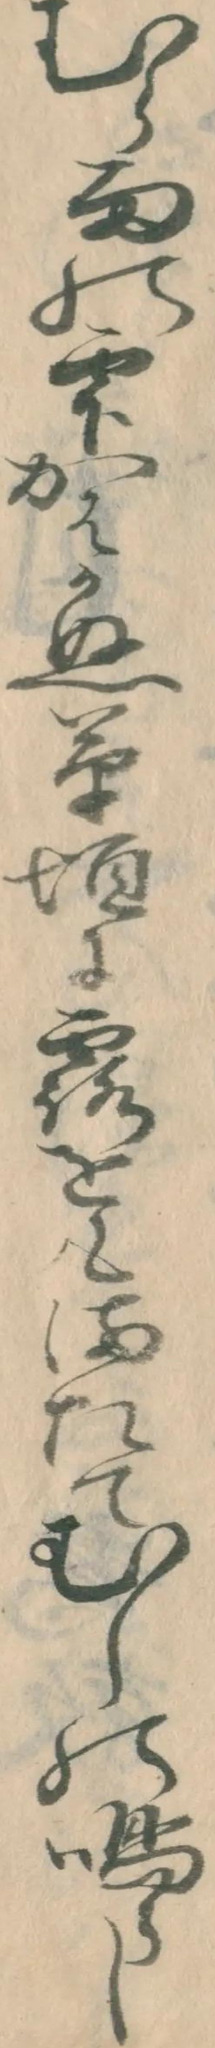むら雨の雫かはかぬ草垣に露をもまたてむしの鳴らし

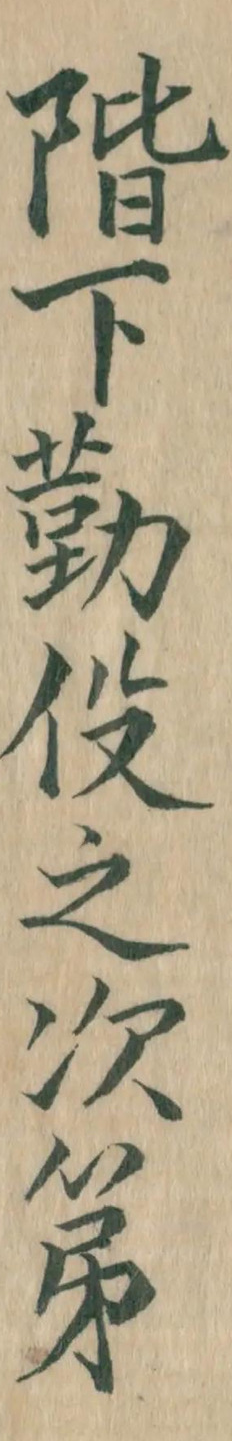階下勤役之次第

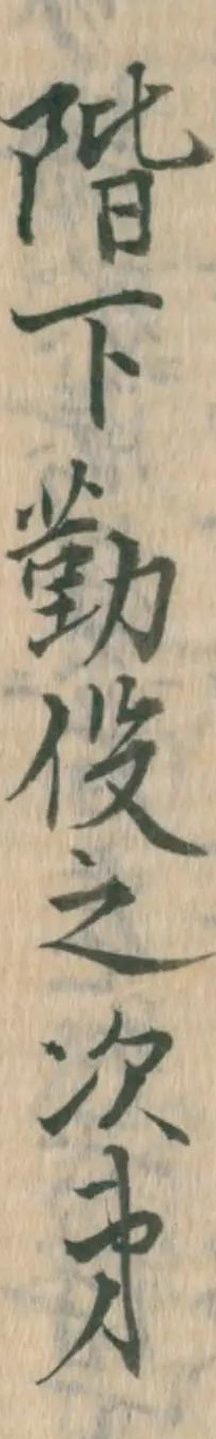階下勤役之次第
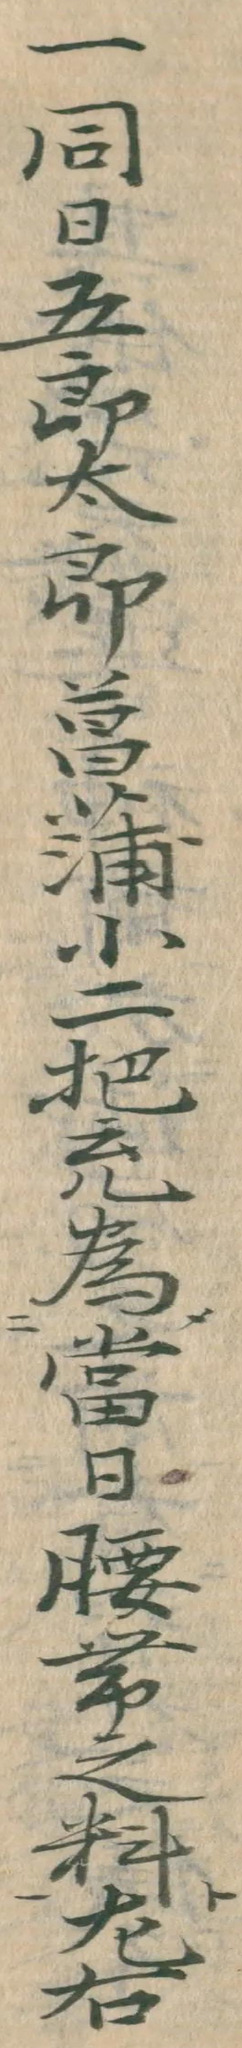一同日五郎太郎菖蒲小二把充為当日腰帯之料左右
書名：賀茂社記録. 第8冊
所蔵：国立国会図書館 National Diet Library, JAPAN
